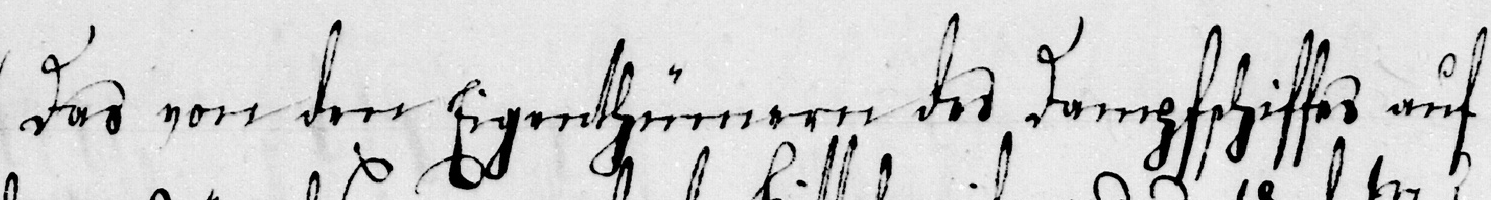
Das von den Eigenthümern des Dampfschiffes auf
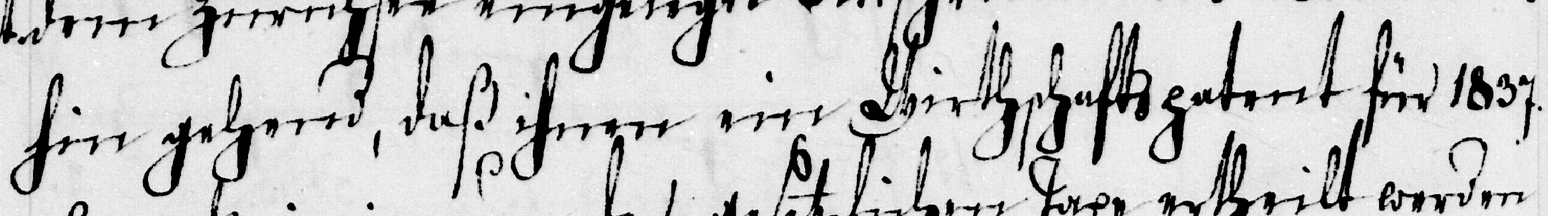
hin gehend, daß ihnen ein Wirthschaftspatent für 1837.
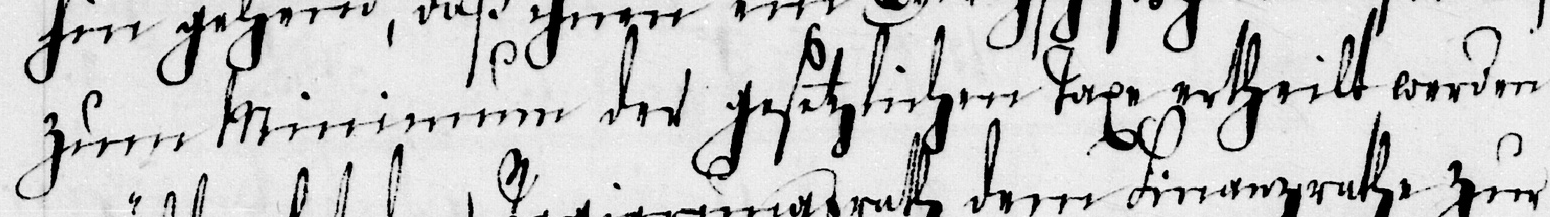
zum Minimum der gesetzlichen Taxe ertheilt werden
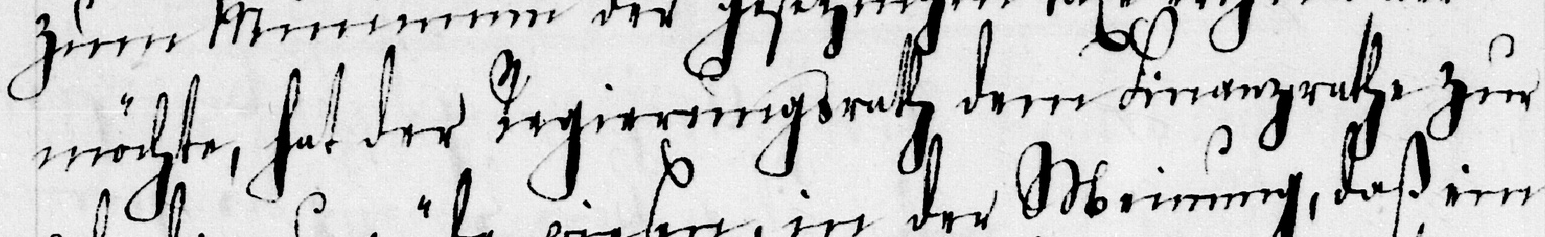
möchte, hat der Regierungsrath dem Finanzrath zur
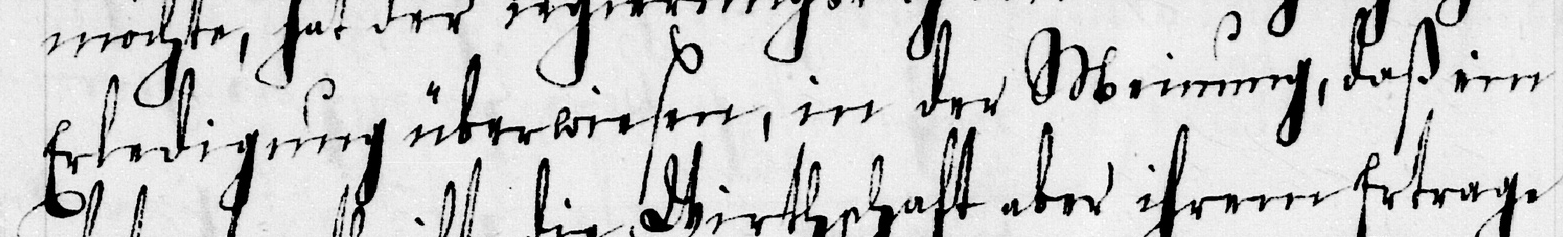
Erledigung überwiesen, in der Meinung, daß ein
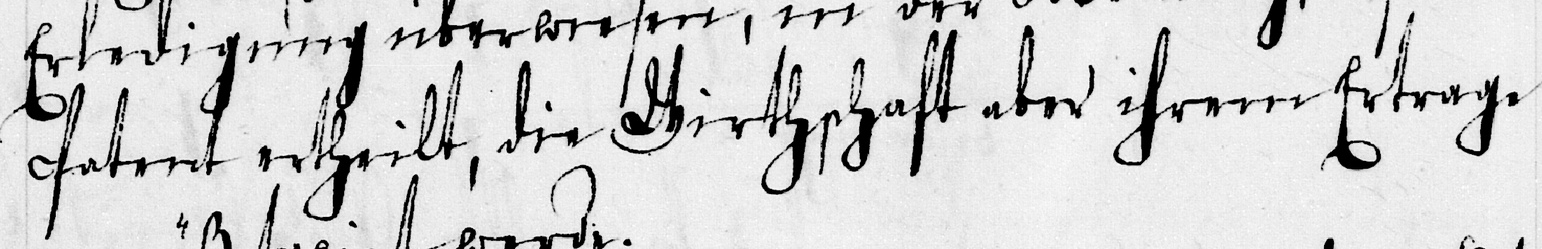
Patent ertheilt, die Wirthschaft aber ihrem Ertrage
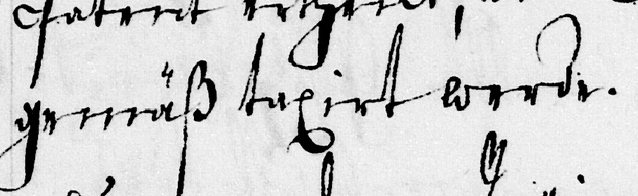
gemäß taxirt werde.
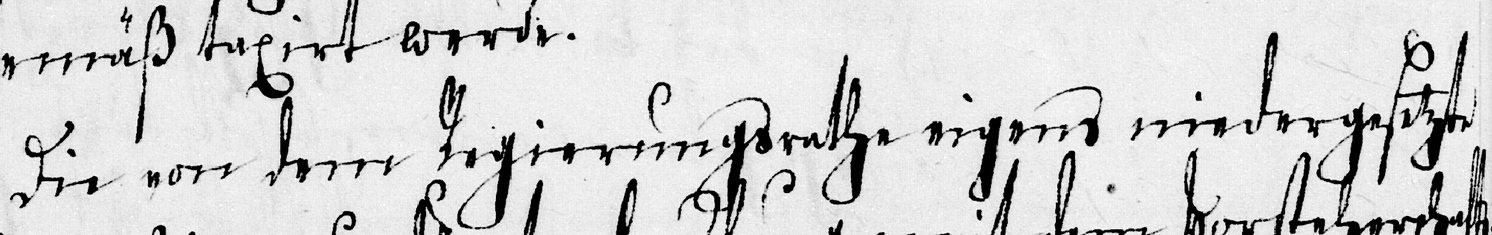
Die von dem Regierungsrathe eigens niedergesetzte
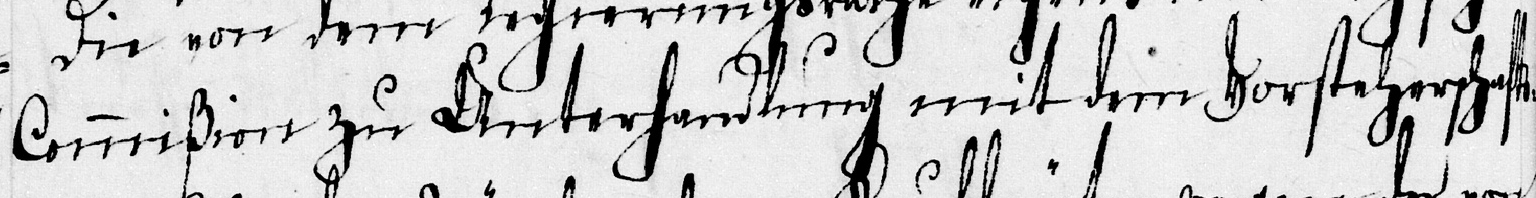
Commißion zu Unterhandlung mit dem Vorsteherscha¬
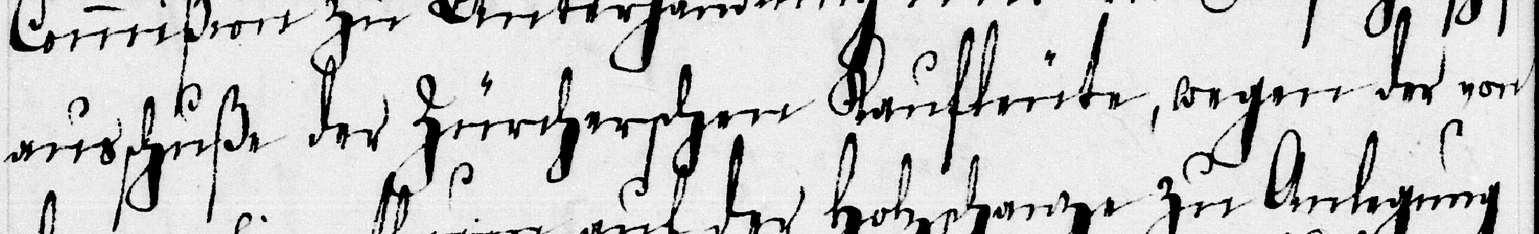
ausschuße der Zürcherschen Kaufleute, wegen der von
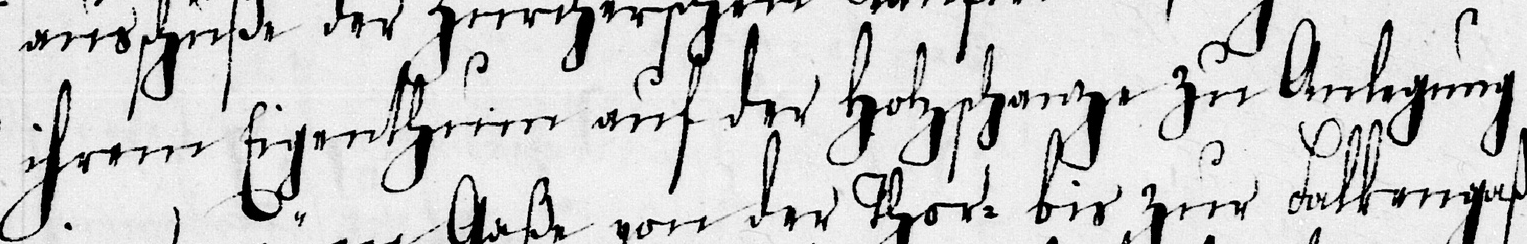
ihrem Eigenthum auf der Holzschanze zu Anlegung
